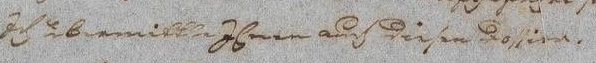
Ich übermittle Ihnen auch diesen Dossier.
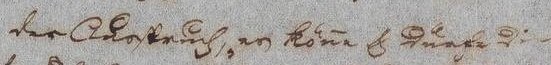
Der Ausspruch, «es könne & dürfe die
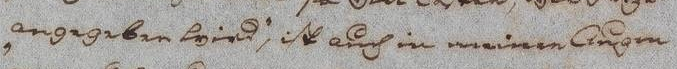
angegeben wird», ist auch in meinen Augen
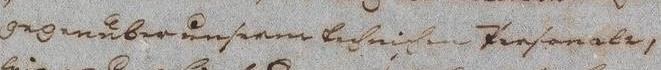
gegenüber unserm technischen Personale,
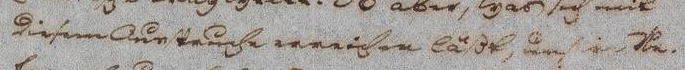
diesem Ausspruche erreichen läßt, unsere Un-
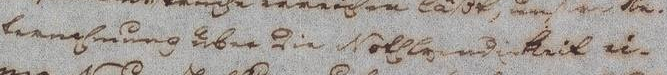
ternehmung über die Nothwendigkeit ei-
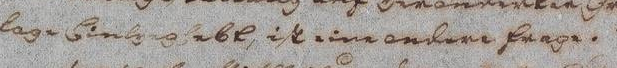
lage hinweghebt, ist eine andere Frage.
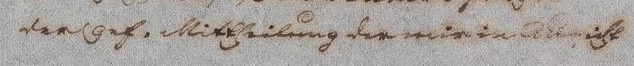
Der gef. Mittheilung der mir in Aussicht
